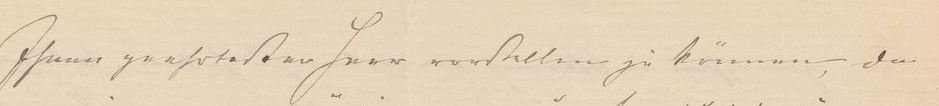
Ihnen geehrtester Herr vorstellen zu können, da
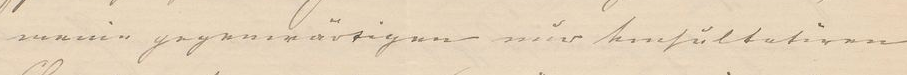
meine gegenwärtigen nur konsultativen
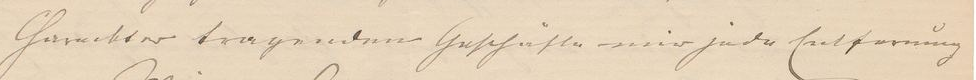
Charakter tragenden Geschäfte mir jede Entfernung
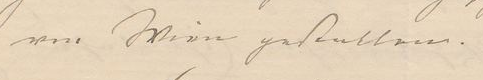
von Wien gestatten.
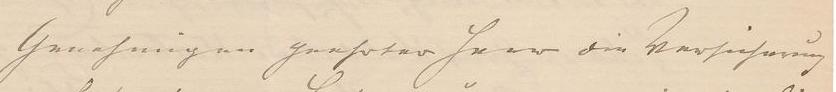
Genehmigen geehrter Herr die Versicherung
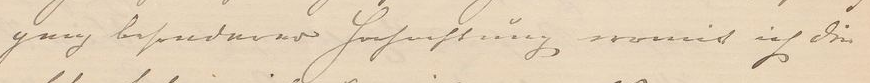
ganz besonderer Hochachtung womit ich die
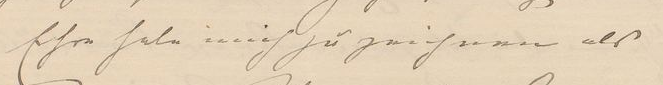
Ehre habe innig zu zeichnen als
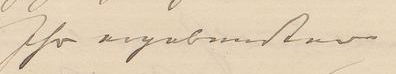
Ihr ergebenster
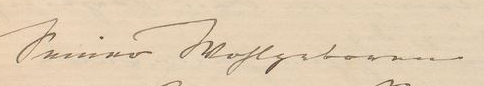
Seiner Wohlgeboren
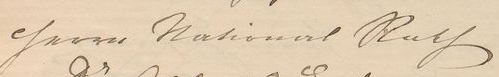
Herrn National Rath
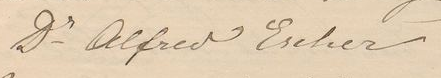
Dr Alfred Escher
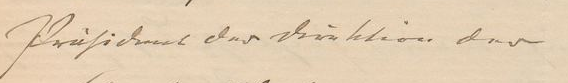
Präsident der Direktion der
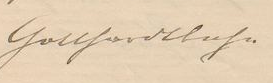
Gotthardtbahn
